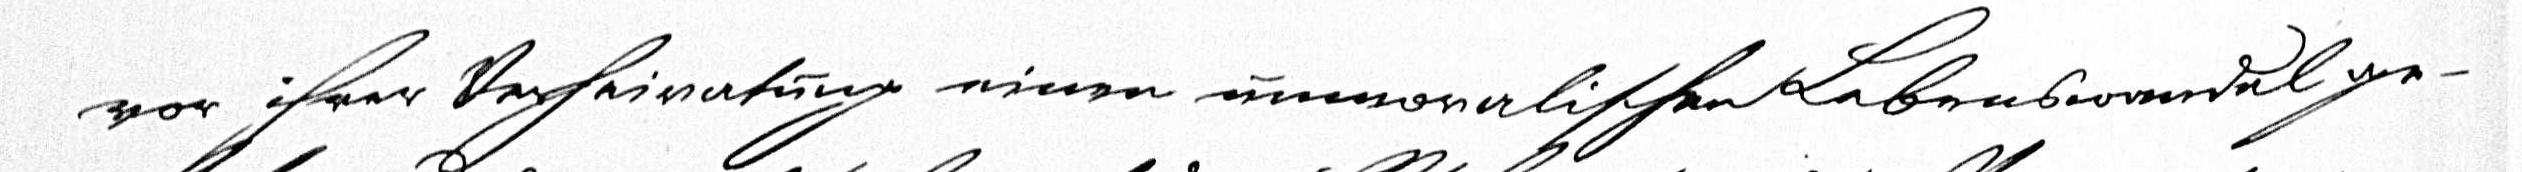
vor ihrer Verheiratung einen unmoralischen Lebenswandel ge¬
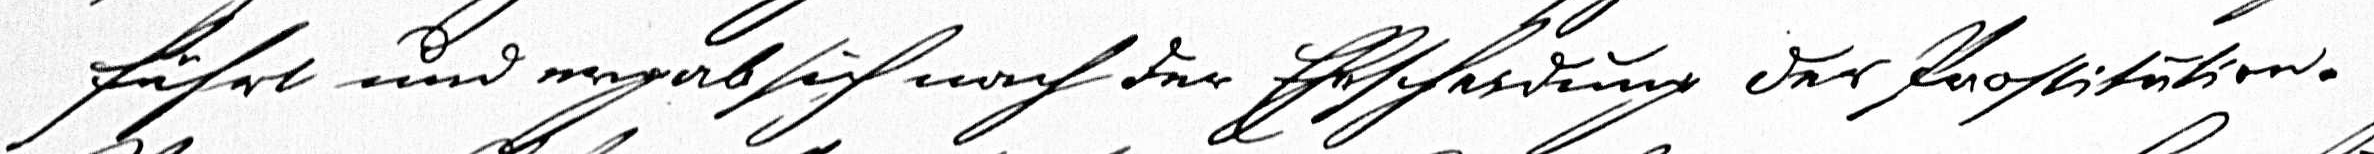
führt und ergab sich nach der Ehescheidung der Prostitution.
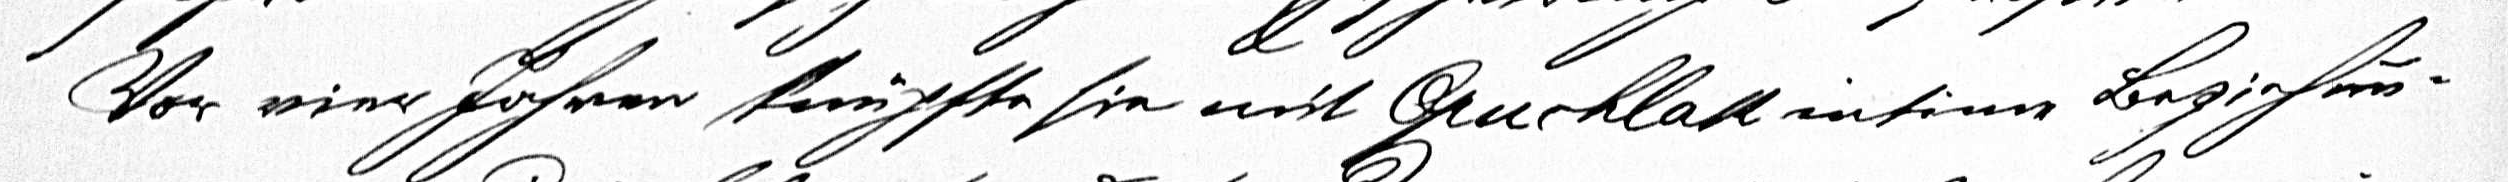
Vor vier Jahren knüpfte sie mit Opuchlak intime Beziehun¬
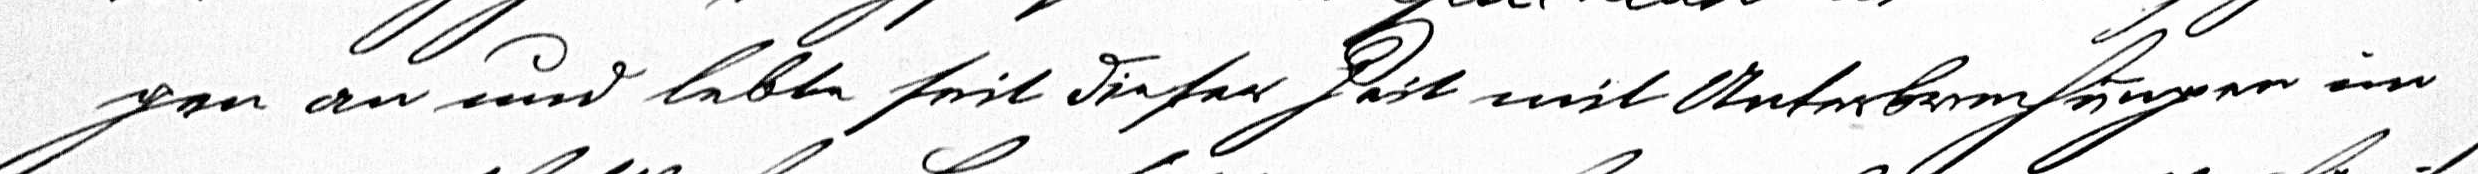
gen an und lebte seit dieser Zeit mit Unterbrechungen ein
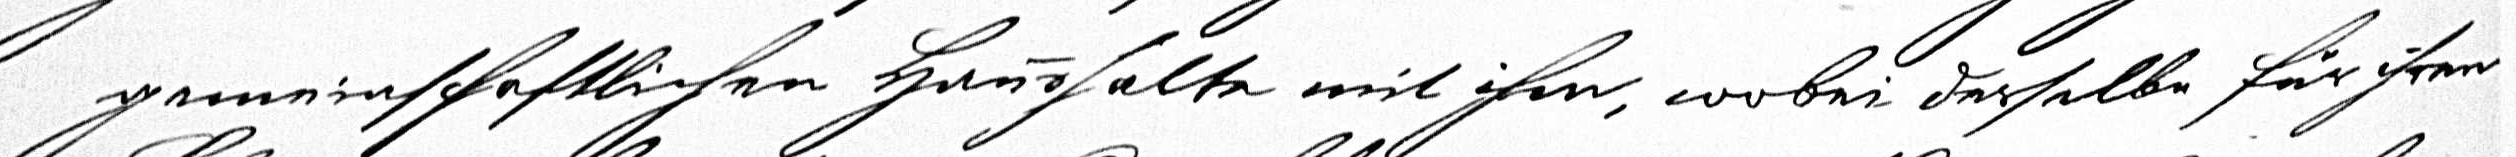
gemeinschaftlichen Haushalte mit ihm, wobei derselbe für ihren
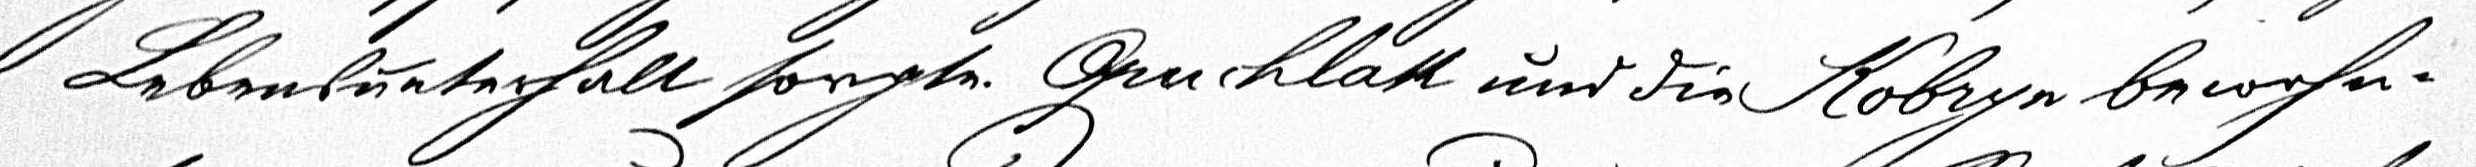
Lebensunterhalt sorgte. Opuchlak und die Kobryn bewohn¬
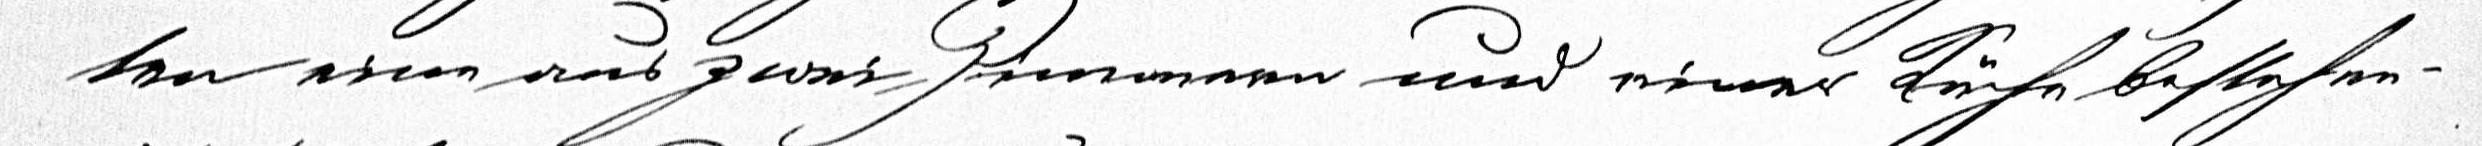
ten eine aus zwei Zimmern und einer Küche bestehen¬
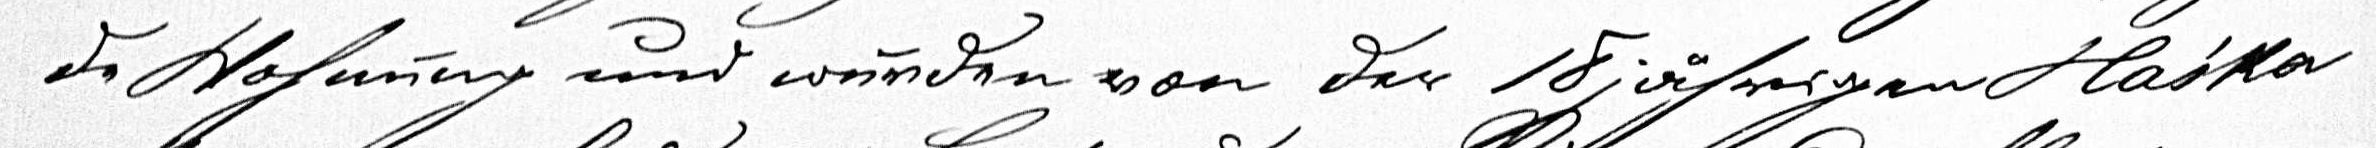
de Wohnung und wurden von der 18jährigen Haśka
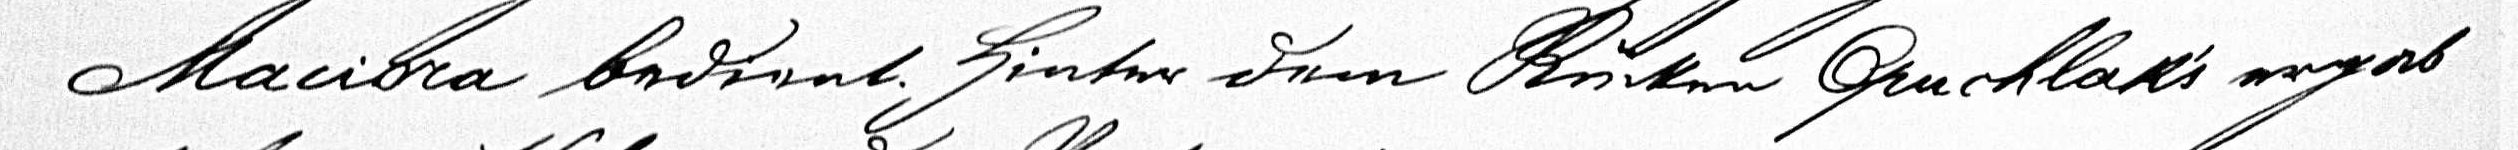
Maciora bedient. Hinter dem Rücken Opuchlak’s ergab
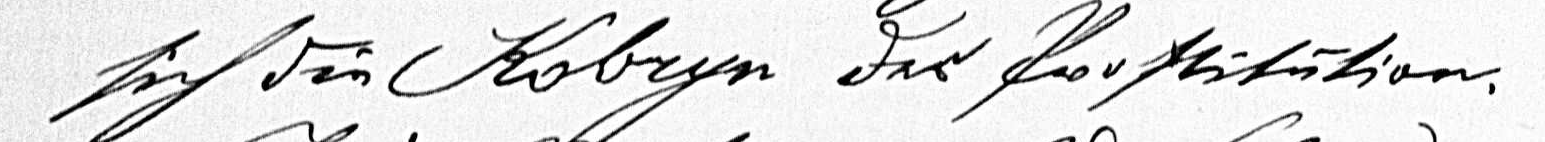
sich die Kobryn der Prostitution.
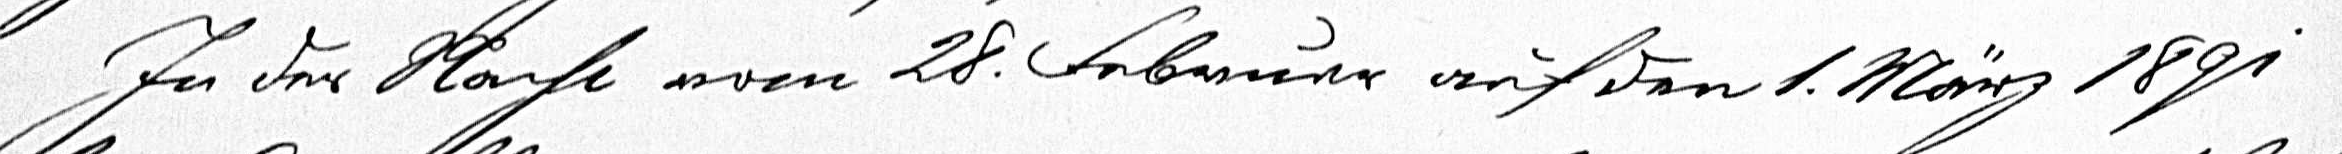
In der Nacht vom 28. Februar auf den 1. März 1891
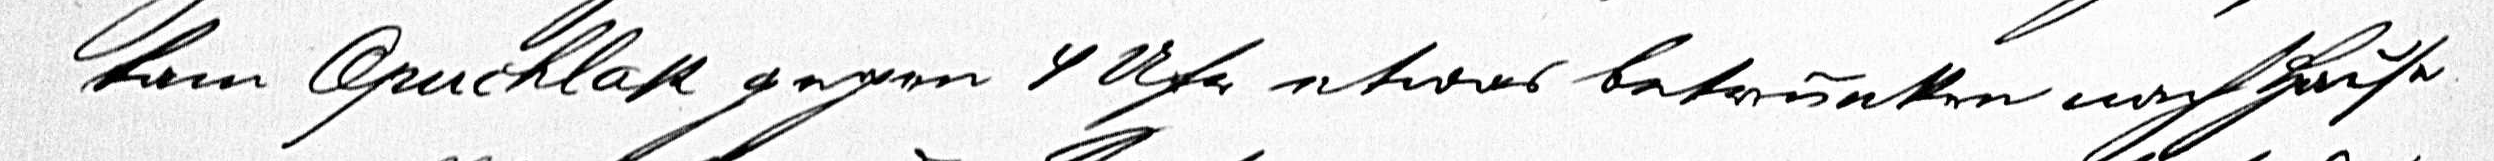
kam Opuchlak gegen 4 Uhr etwas betrunken nach Hause
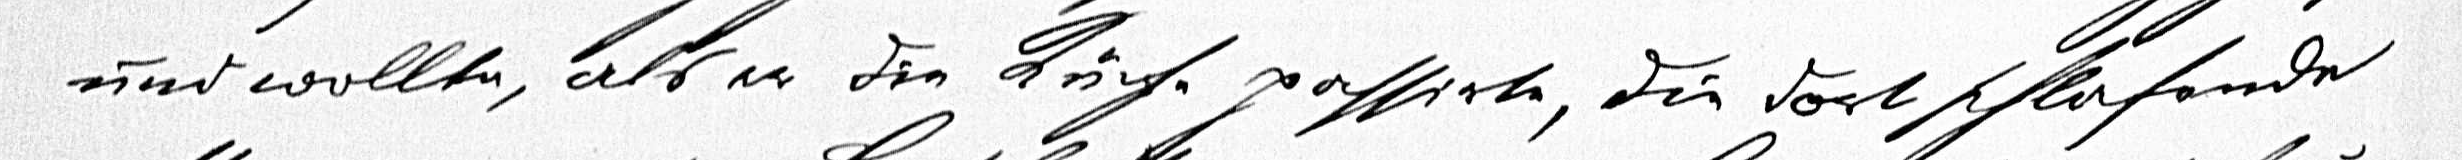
und wollte, als er die Küche passirte, die dort schlafende
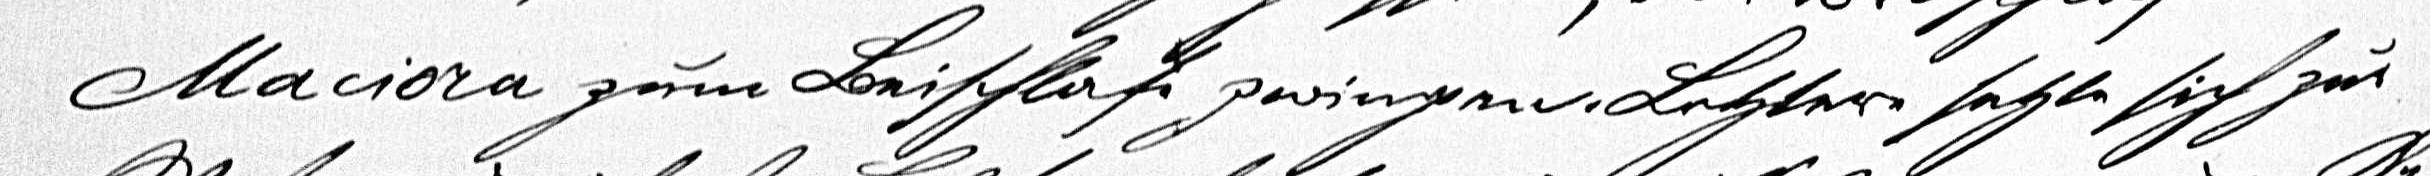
Maciora zum Beischlaf zwingen. Letztere setzte sich zur
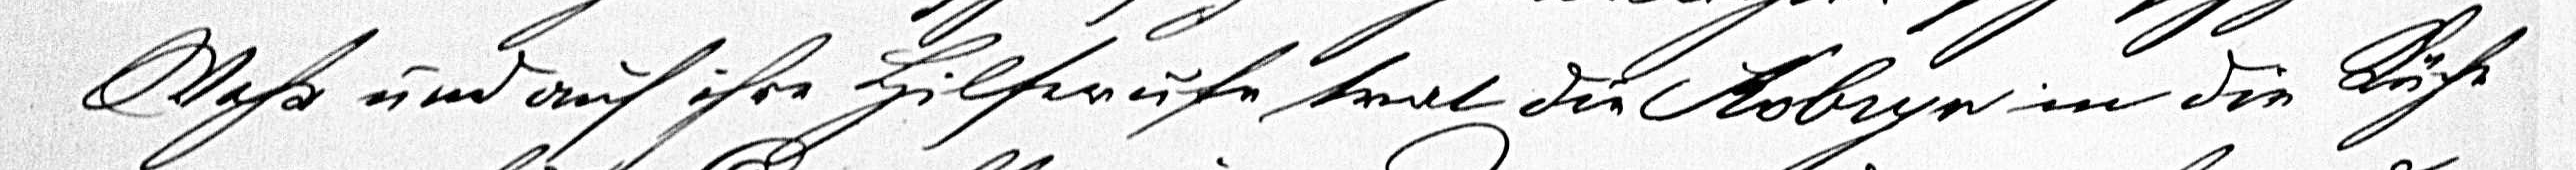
Wehr und auf ihre Hilferufe trat die Kobryn in die Küche
